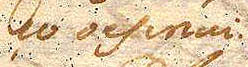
ço o escreui.
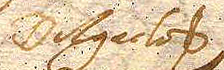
Delgado
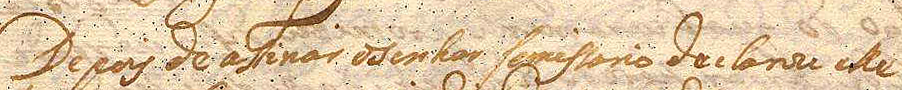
Depois de assinar o senhor Comissario declarou elle
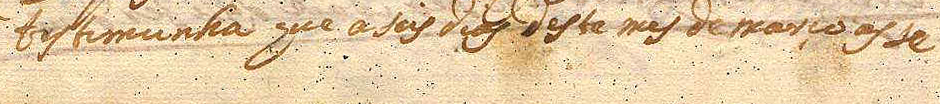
testemunha que a seis dias deste mes de março as se
